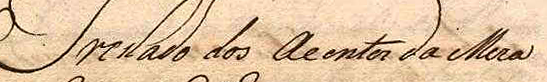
Treslado dos acentos da Meza
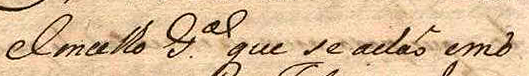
e Concelho G.al que se achaõ em o
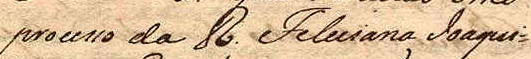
processo da R. Feleciana Ioaqui
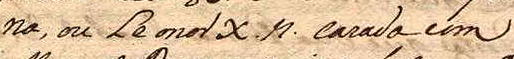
na, ou Leonor x. n. cazada com
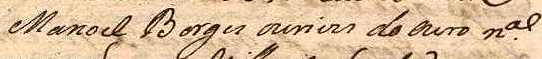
Manoel Borges, ouriues do ouro n.al
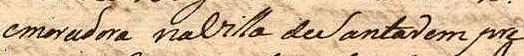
e moradora na Villa de Santarem pre
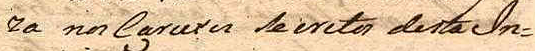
za nos Carceres secretos desta In
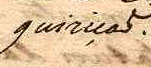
quiziçaõ.
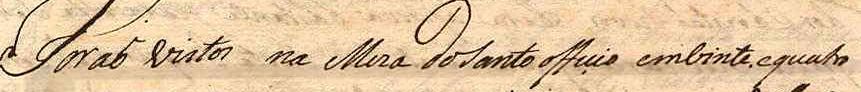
Foraõ vistos na Meza do Santo officio em vinte e quatro
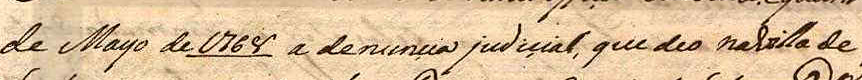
de Mayo de 1768 a denuncia judicial, que deo na Villa de
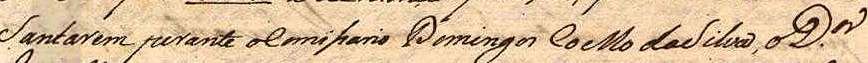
Santarem perante o Comissario Domingos Coelho da Silva, o D.or
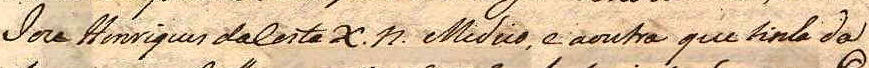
Ioze Henriques da Costa x. n. Medico, e a outra que tinha da
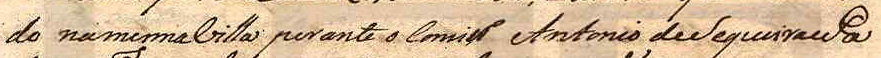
do na mesma Villa perante o Comisro Antonio de Sequeira e Pa
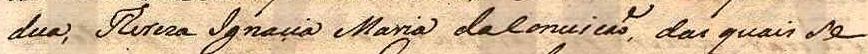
dua, Thereza Ignacia Maria da Conceiçaõ, das quais se
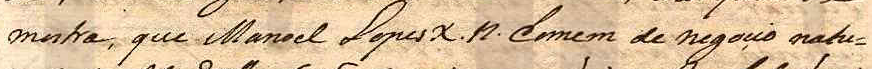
mostra, que Manoel Lopes x. n. homem de negocio, natu
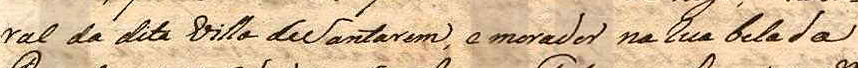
ral da dita Villa de Santarem, e morador na Rua bela da
